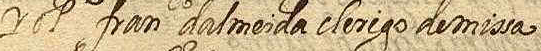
item o Pe franco dalmeida clerigo de missa
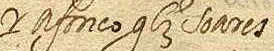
item afonco glz̄ Soares
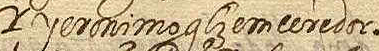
item yeronimo glz̄ emceredor
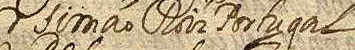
item Simão Roiz̄ PortugaL
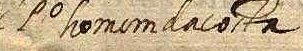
item Po homem da costa
